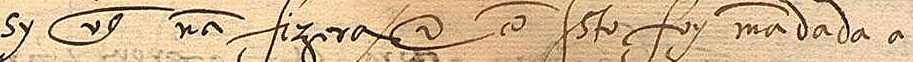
sy o q̅ n̅a fizera / e c̅o Jsto foy m̅adada a
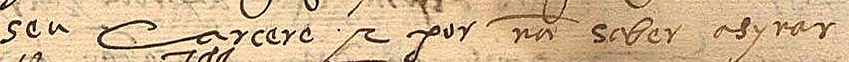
seu Carcere e por n̅a saber asynar
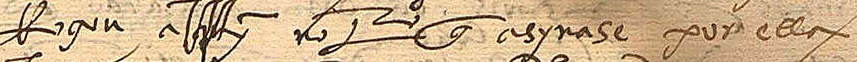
Rogou a My̅ notro q̅ asynase por ella /
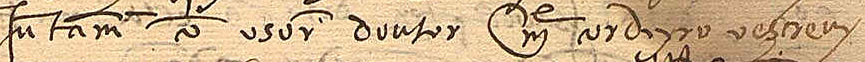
Ju̅tamte c̅o o so̅r doutor mel cordeyro o escreuy
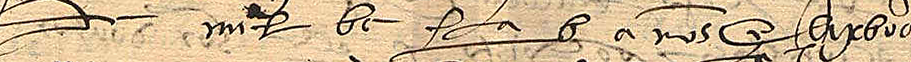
de mil bc Lta b an̅os e̅ lixboa
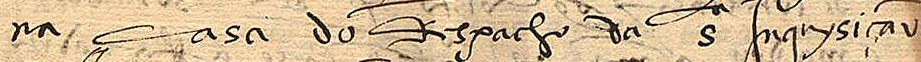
na casa do despacho da sta Jnquysição
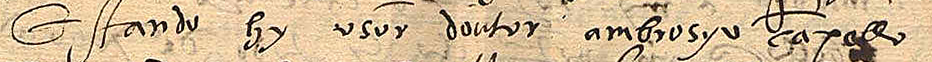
Estando hy o so̅r doutor ambrosyo c̅apello
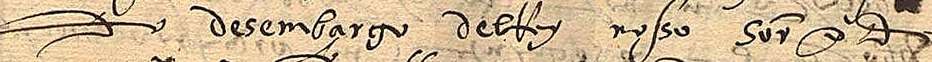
do desembargo del Rey nosso so̅r e de
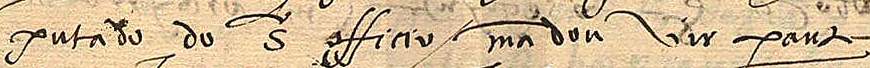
putado do sto officio m̅adou vir ꝑante
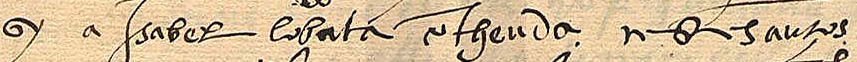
sy a Jsabel lobata c̅otheuda nestes autos
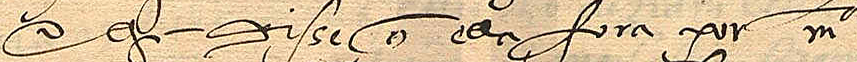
e lhe disse q̅ ella fora por mtas
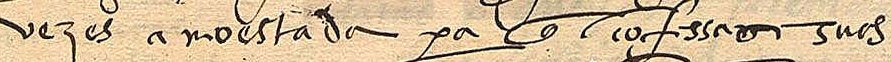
vezes amoestada ꝑa q̅ c̅ofessase suas
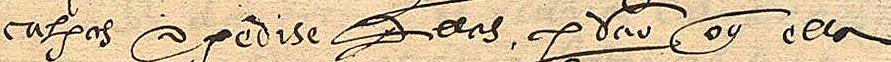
culpas e pedise Dellas ꝑdão o q̅ ella
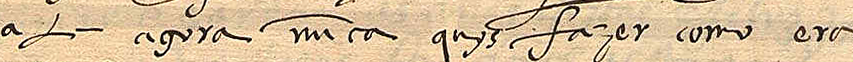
ate agora n̅uca quys fazer como era
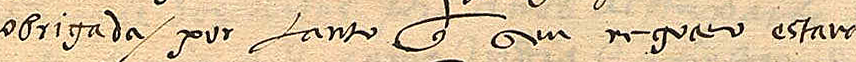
obrigada / por tanto q̅ seu negoceo estaua
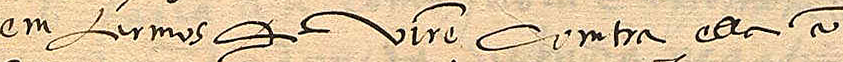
em termos de vir̅e comtra ella c̅o
